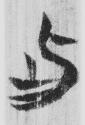此
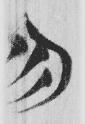勿
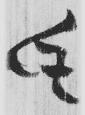氒
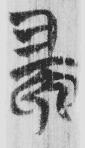耑
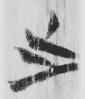之
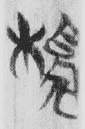{木蜀}
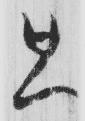也
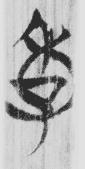季
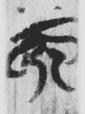而
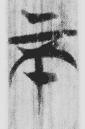不
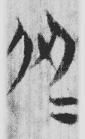仞=
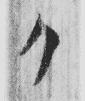人
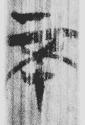不
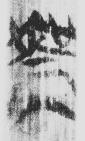{亠舛几}
